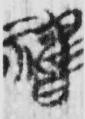禱
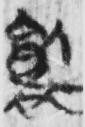○（蝕）
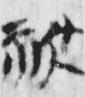○（太）
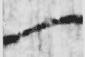一
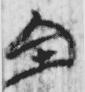全
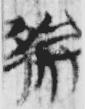豢
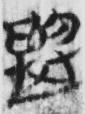○（舉）
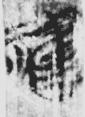禱
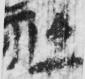社
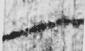一
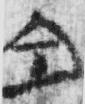全
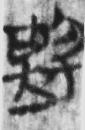○（舉）
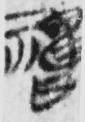禱
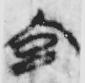宮
